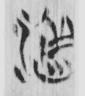{沈臼}
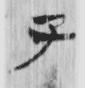子
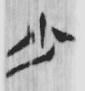少
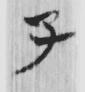子
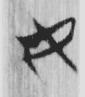女
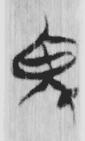鬼
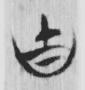由
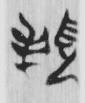{毛見}
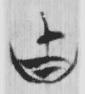由
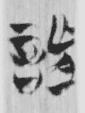{言亡壬}
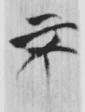不
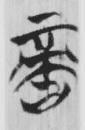啻
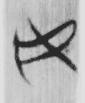女
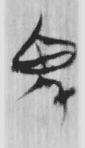鬼
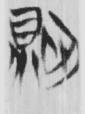則
